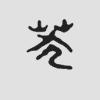{艹犬}
